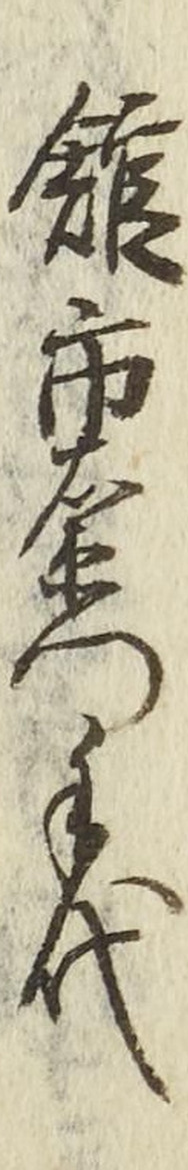舘市右衛門手代
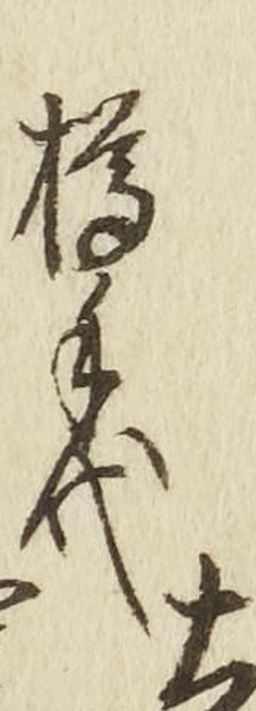樽手代
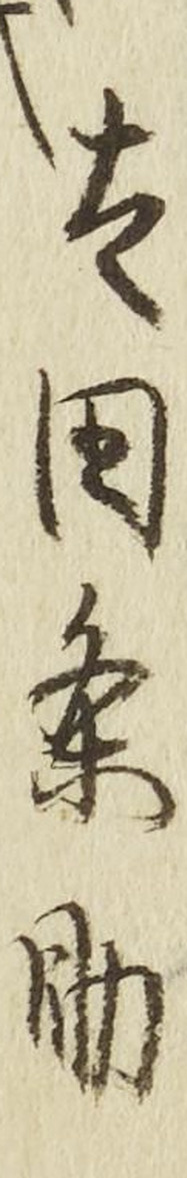太田条助
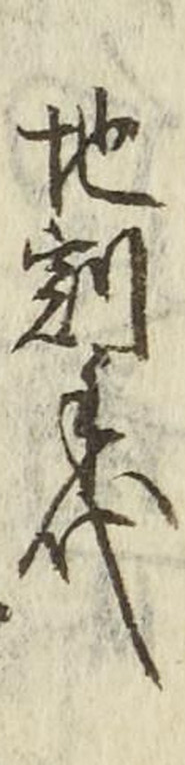地割手代
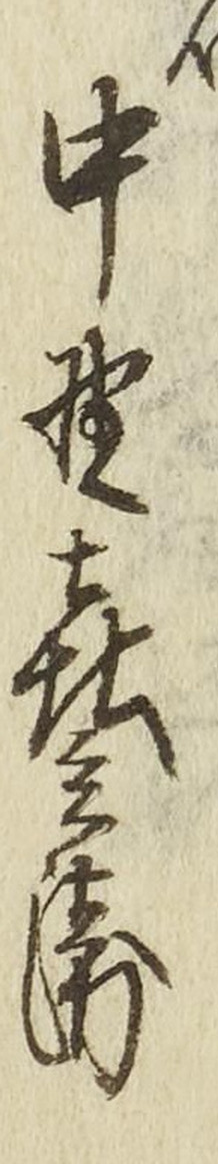中野喜兵衛

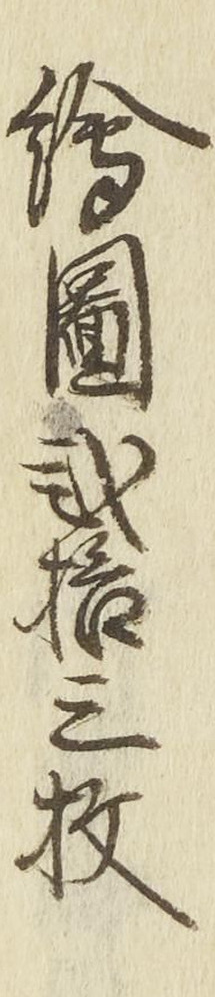絵図弐拾三枚
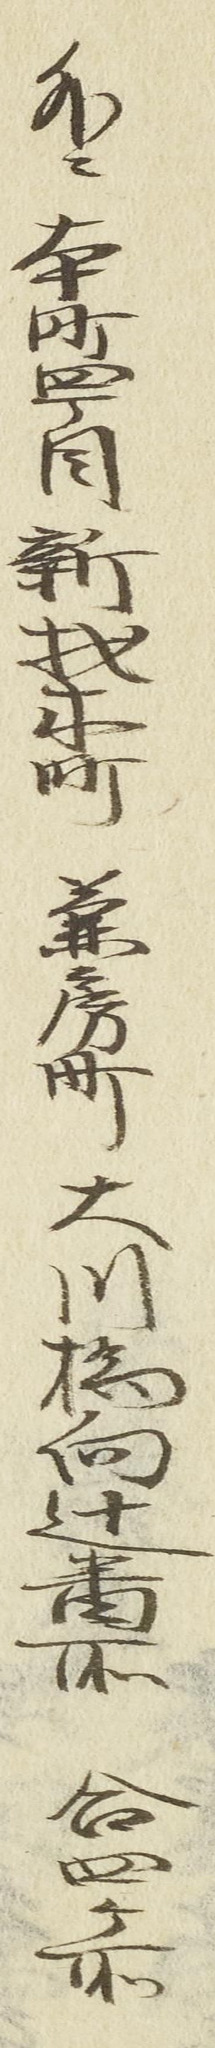外ニ本町四丁目新材木町兼房町大川橋向辻番所合四ケ所
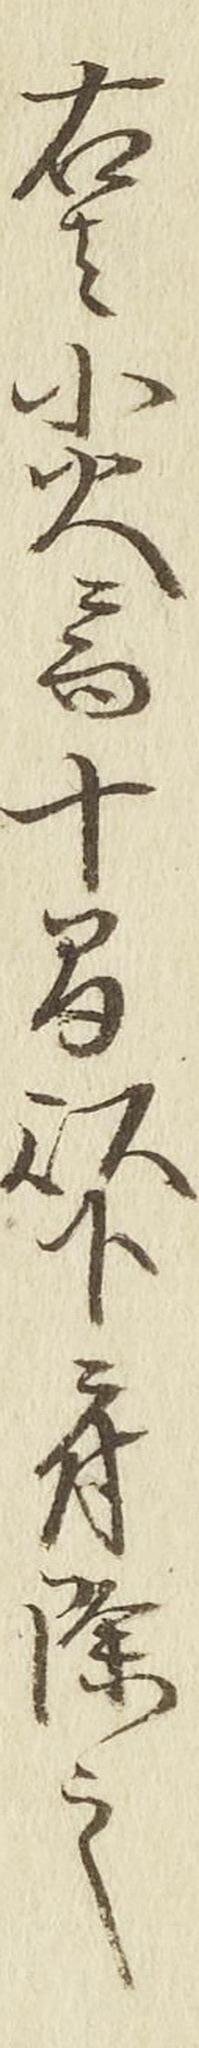右者小火ニ而十間以下ニ付除之
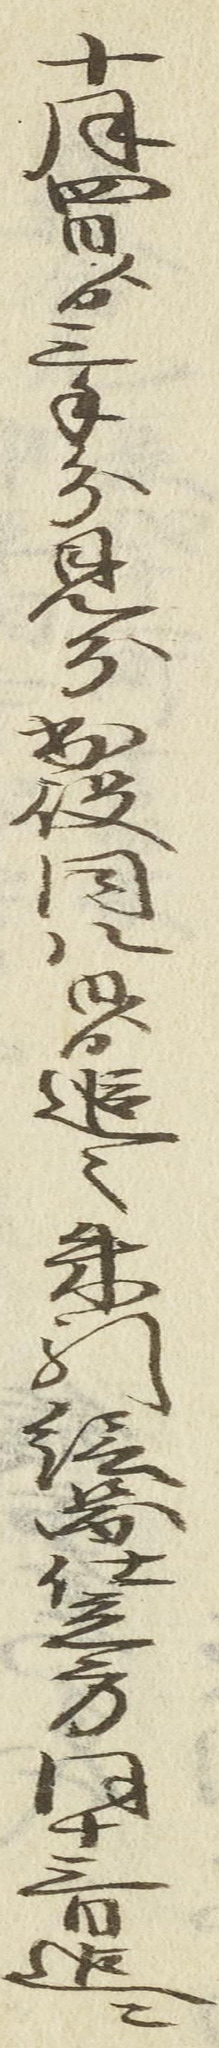十月四日ゟ三年分見分出役同八日ゟ追々朱引絵図仕立方同十三日迄ニ
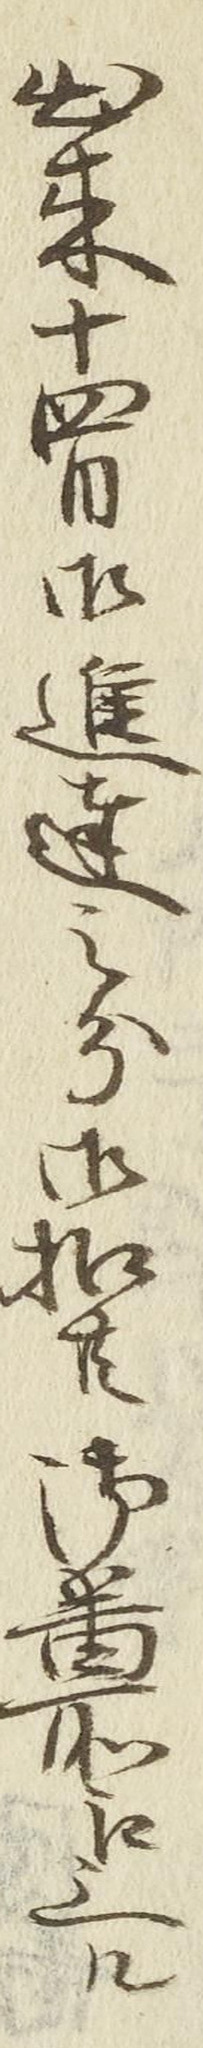出来十四日御進達之分御扣共御番所江上ル
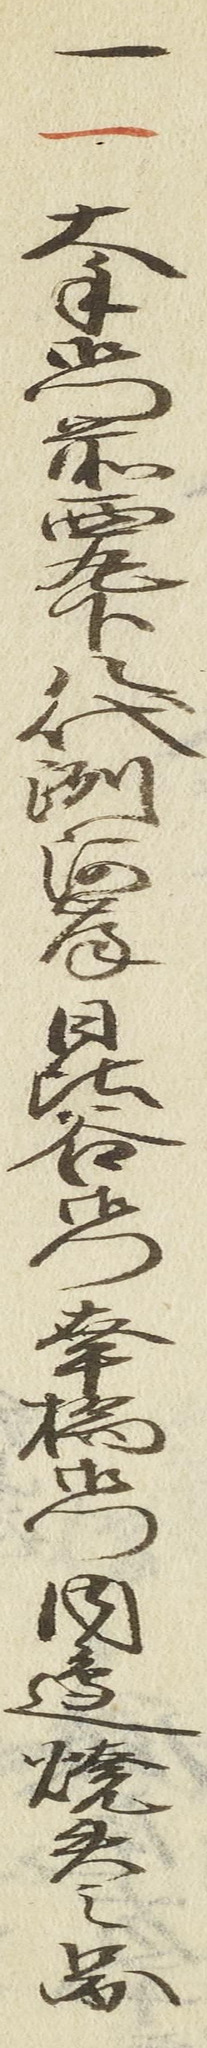一大手御門前西丸下八代洲河岸日比谷御門幸橋御門内迄焼失之図
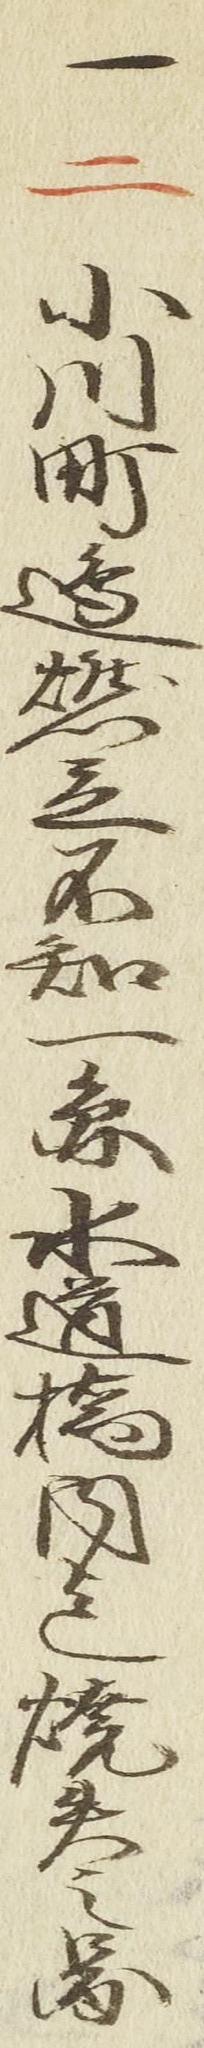一小川町辺燃立不知一円水道橋内迄焼失之図
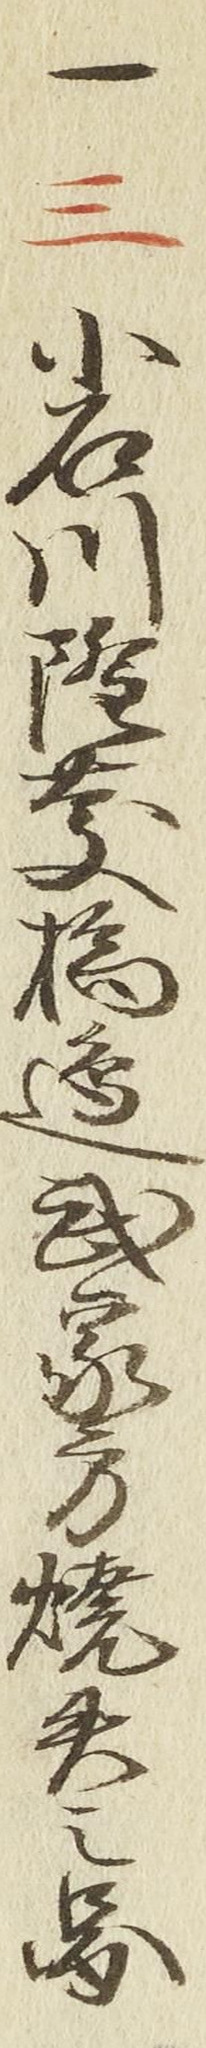一小石川隆慶橋辺武家方焼失之図
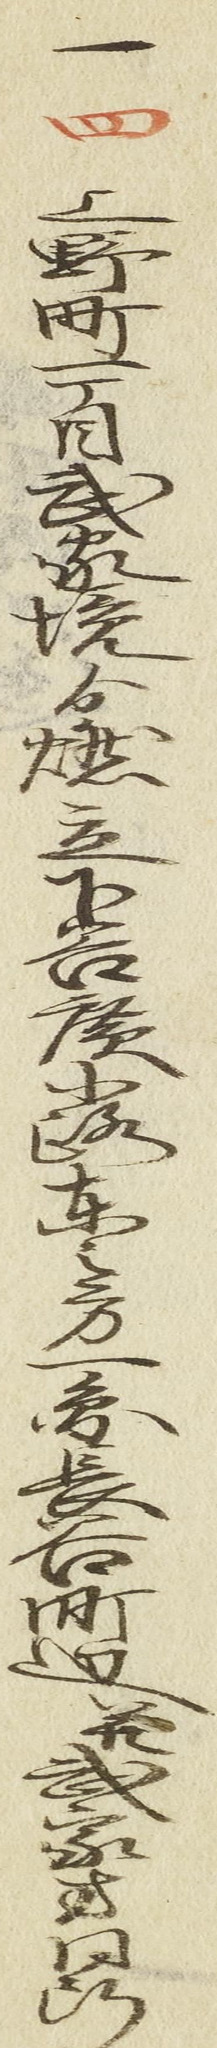一上野町一丁目武家境ゟ燃立下谷広小路東之方一円長谷町幷武家方同断
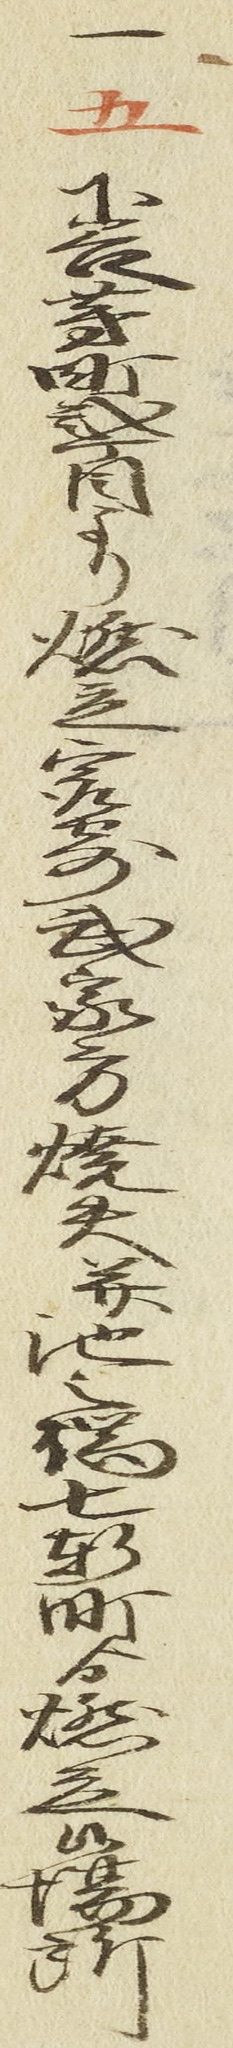一下谷茅町弐丁目より燃立最寄武家方焼失幷池之端七軒町ゟ燃立候場所
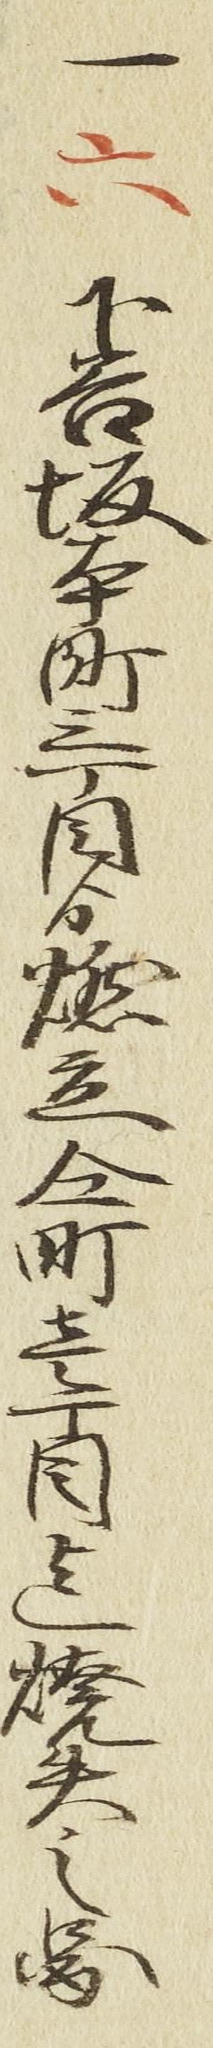一下谷坂本町三丁目ゟ燃立同町壱丁目迄焼失之図
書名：安政二年震災記事　完
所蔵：東京大学地震研究所図書室 Earthquake Research Institute Library, The University of Tokyo, JAPAN
